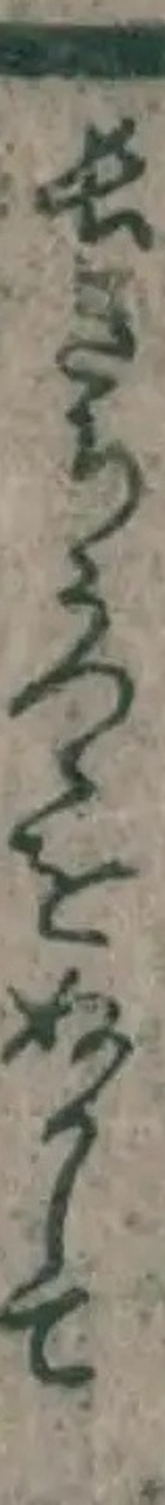長きちうつゝをぬかして
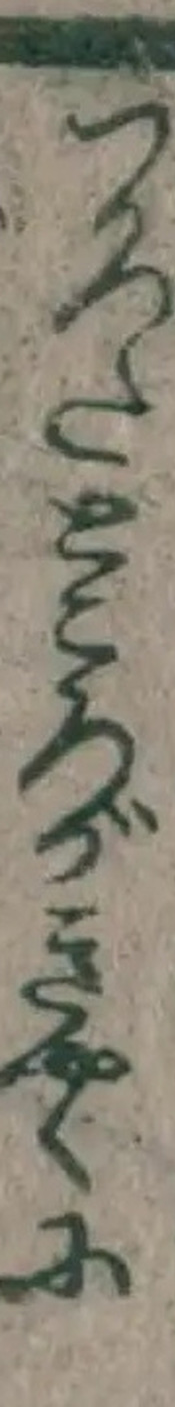つかつたところがきゃくに
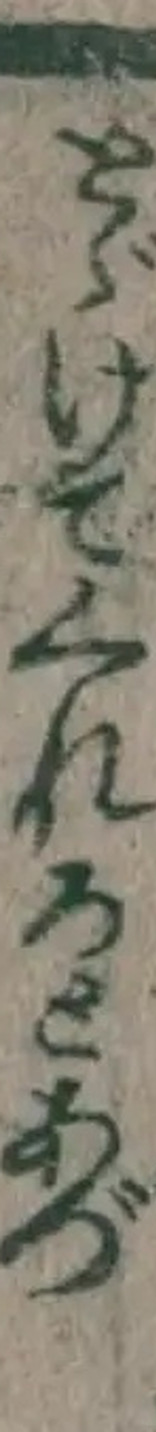とゞけてくれろとあづ
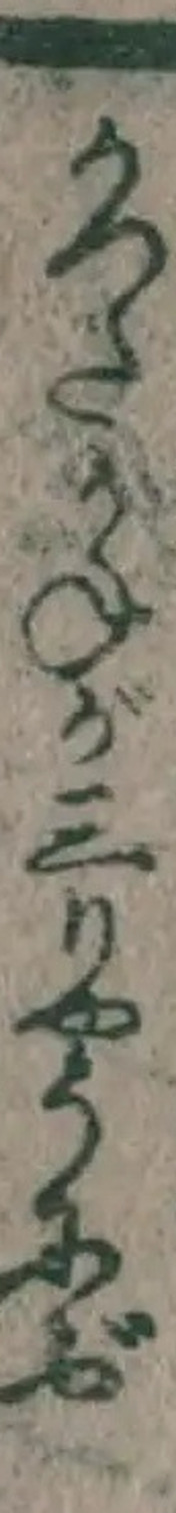かつたかねが三りやうにぶ
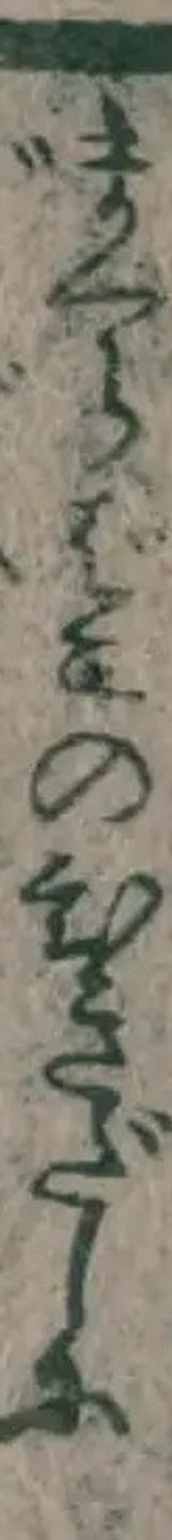まくらばこのひきだしに
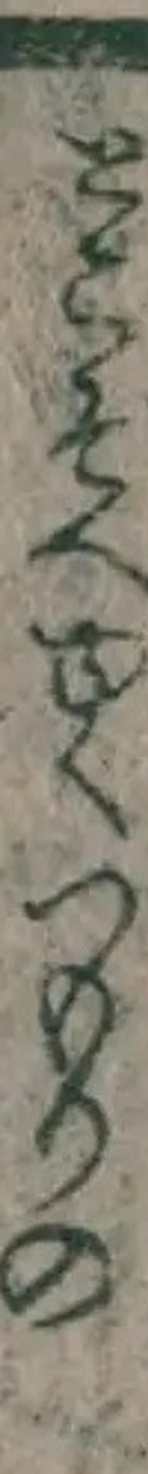どこぞへゆくつもりの
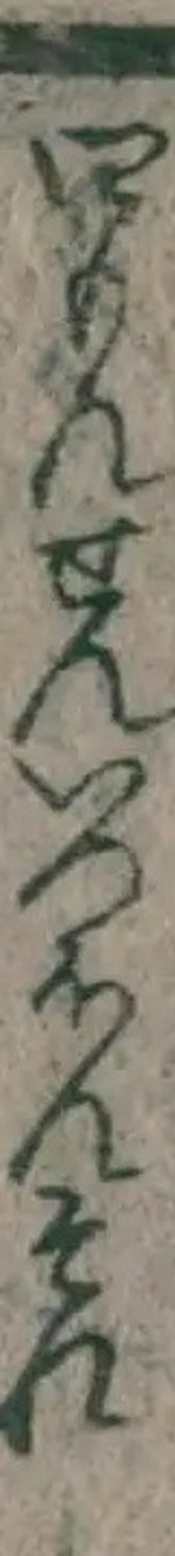四もんせんいつほんそれ
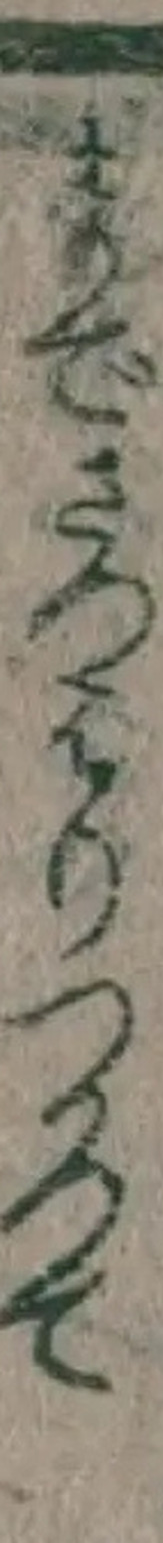までさつはりつかつて
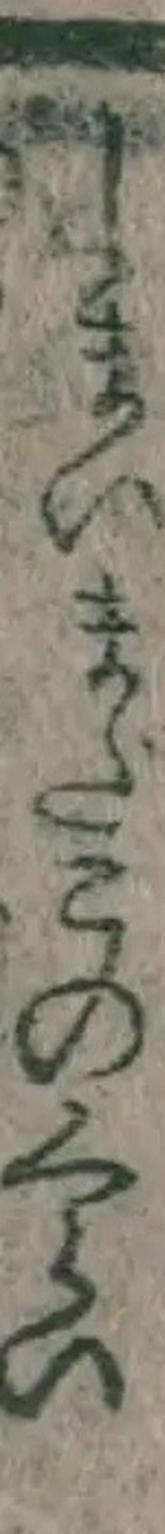しまいまだこのくらい
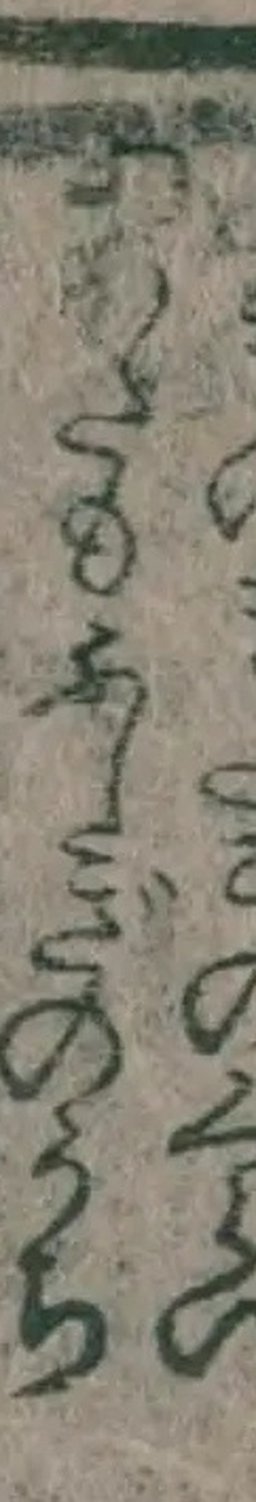あつたもふしぎのうち
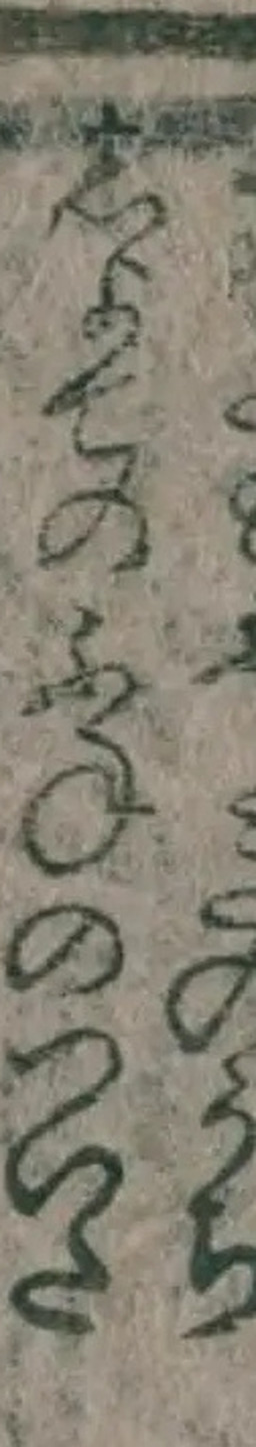しよてのふねのついた
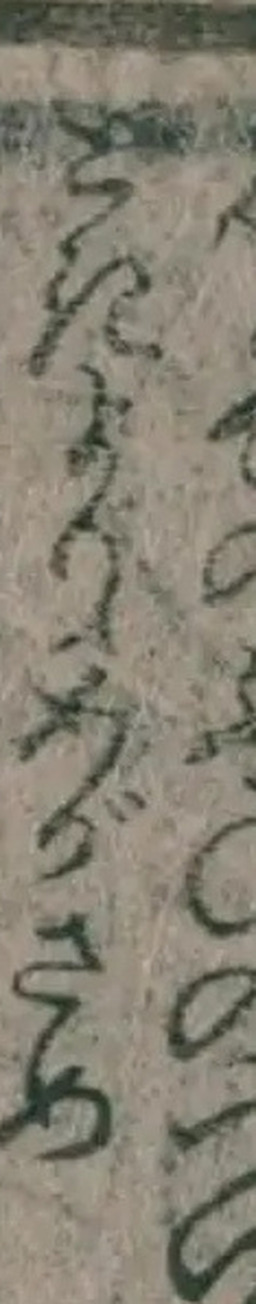ときよりめがさめ
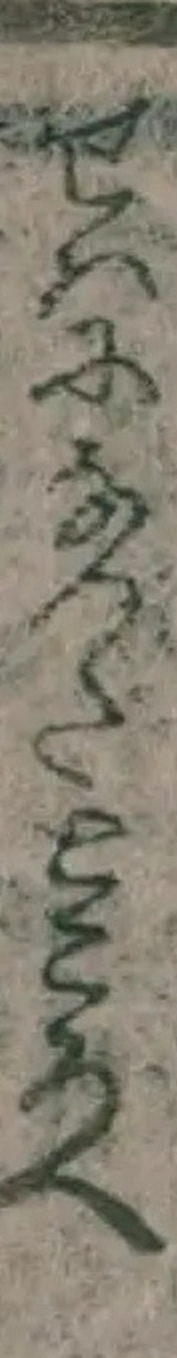せはになつたところへ
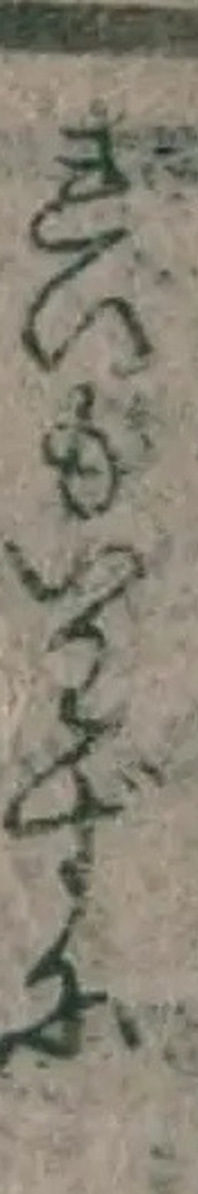れいもいわずに
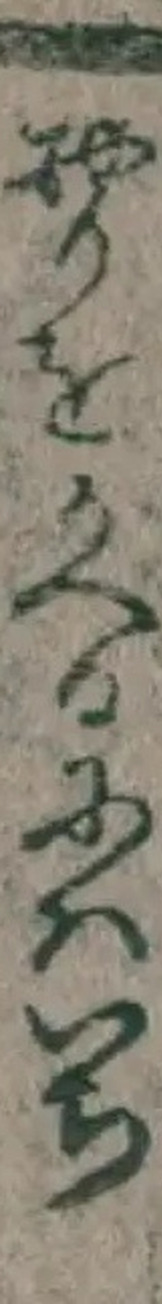おりをかえるにはいち
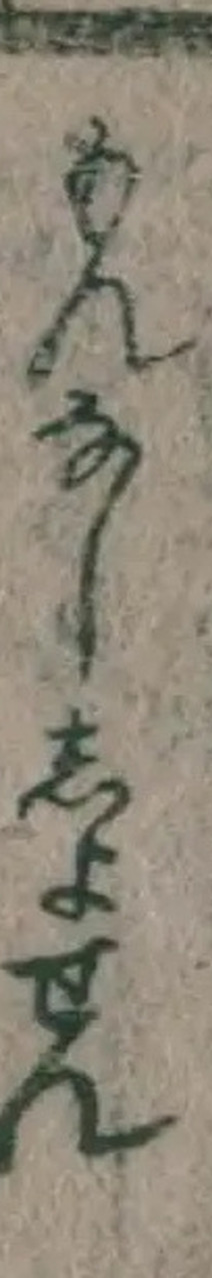もんなししよせん
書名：縦筒放唐の噺 3巻
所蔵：国立国会図書館 National Diet Library, JAPAN
